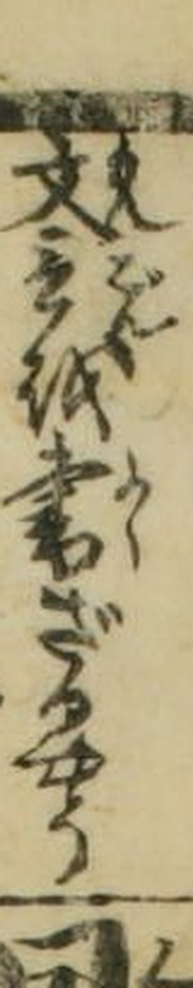文言を書ざるやう
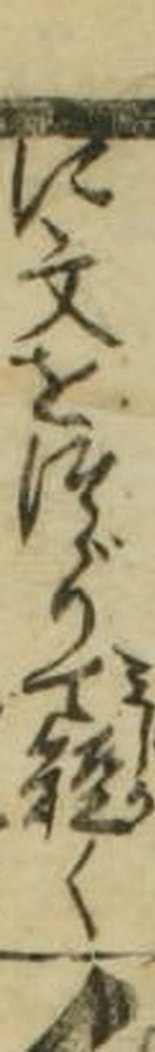に文をつゞりて短く
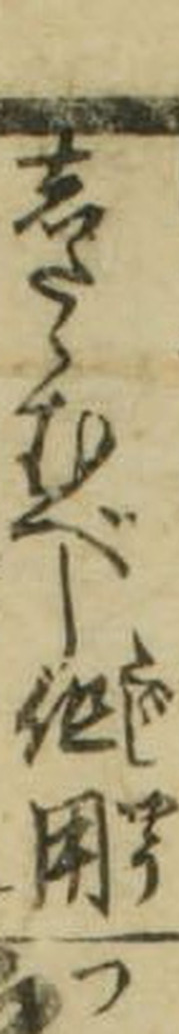したゝむべし但用
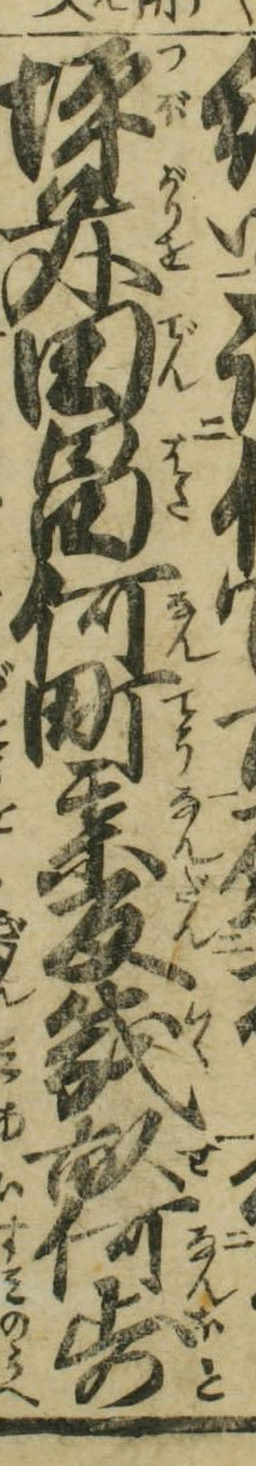坪苅田畠何町某反幾畝何歩
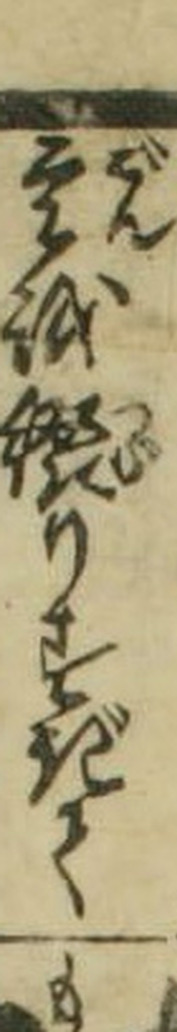言を綴りすぎて
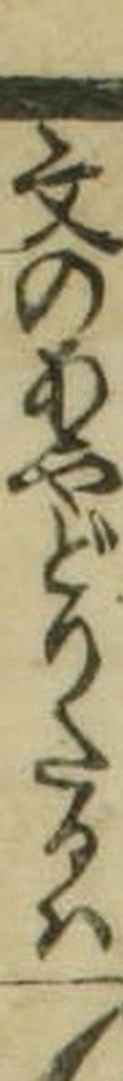文のあやどりたるは
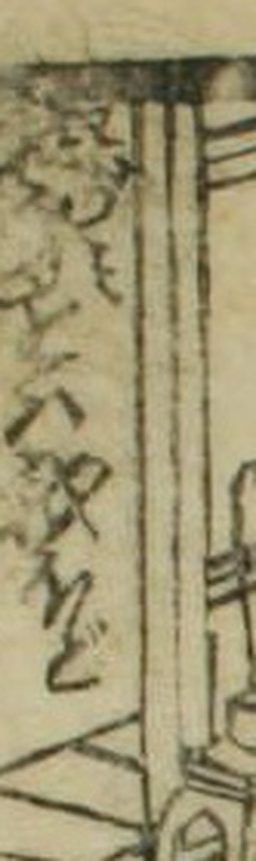をは我ほど
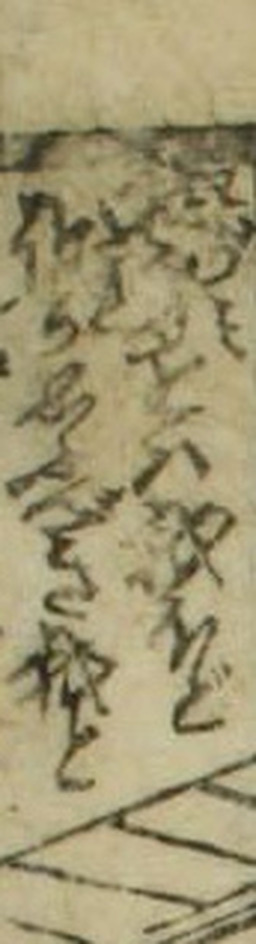誰か思ふべき我と
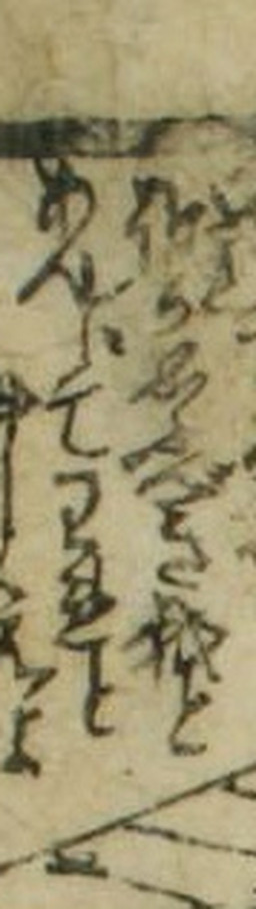あんじてわれと

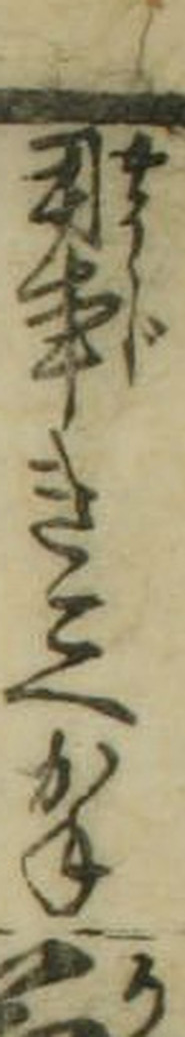用事きこへかね
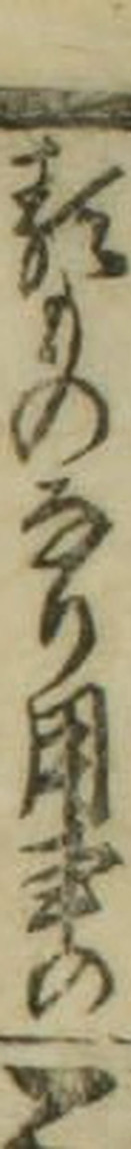るものなり用事の
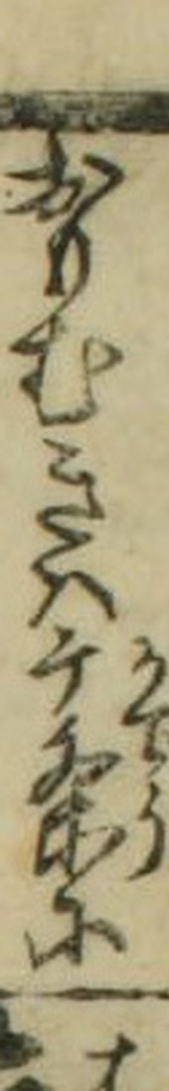おもむきは箇条に
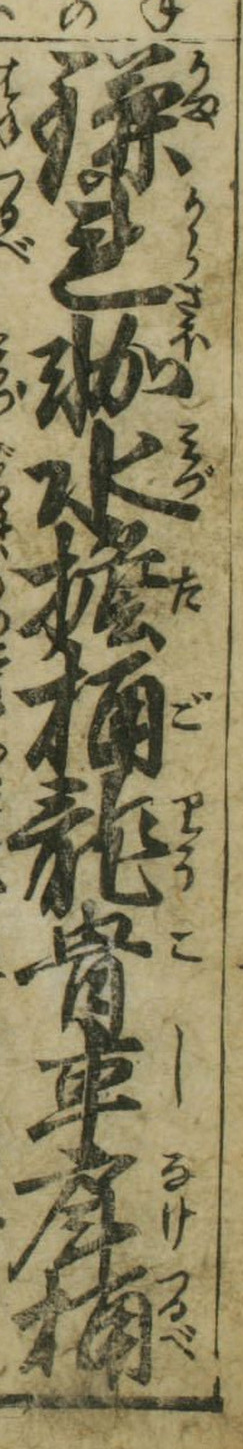鎌連枷水擔桶龍骨車戽桶
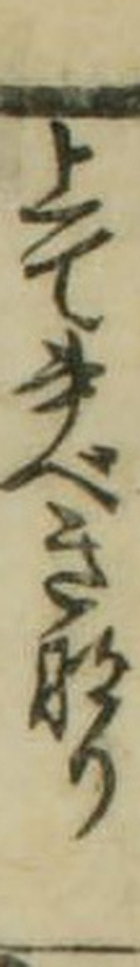上て書べきなり
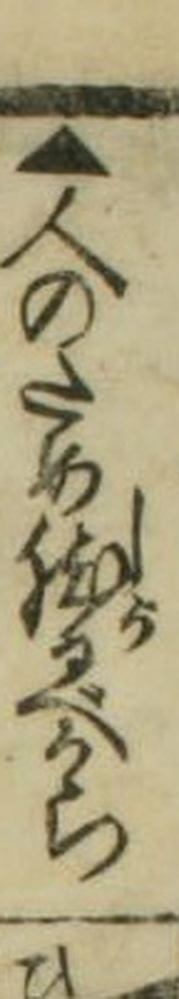▲人のため然るべから
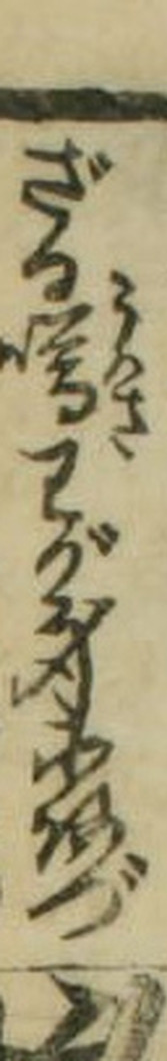ざる噂わが身にあづ
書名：増補職人往来
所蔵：東京学芸大学教育コンテンツアーカイブ
